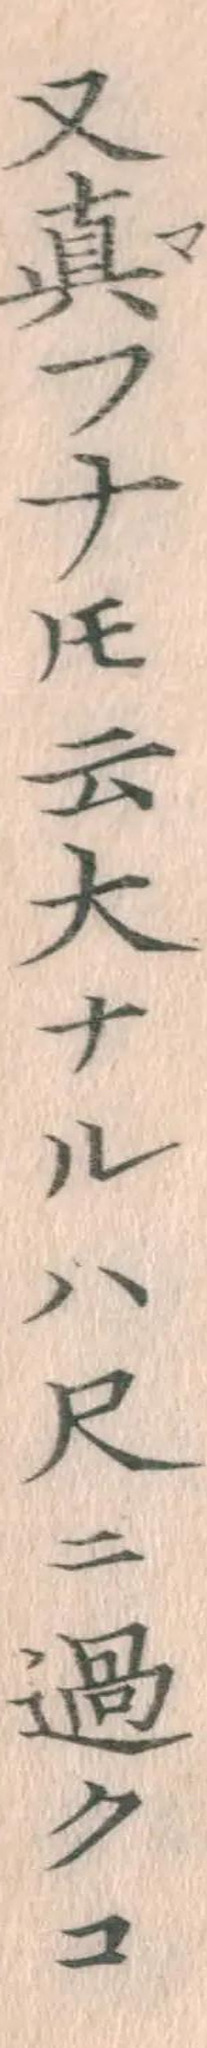又真フナトモ云大ナルハ尺ニ過クコ
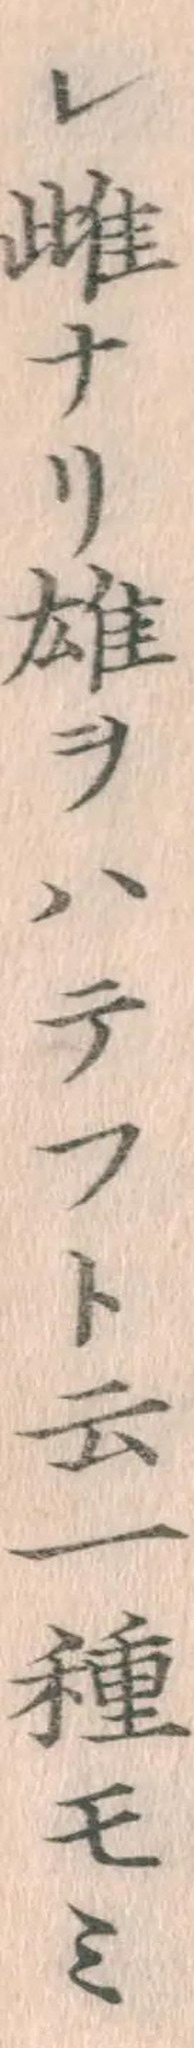レ雌ナリ雄ヲハテフト云一種モミ
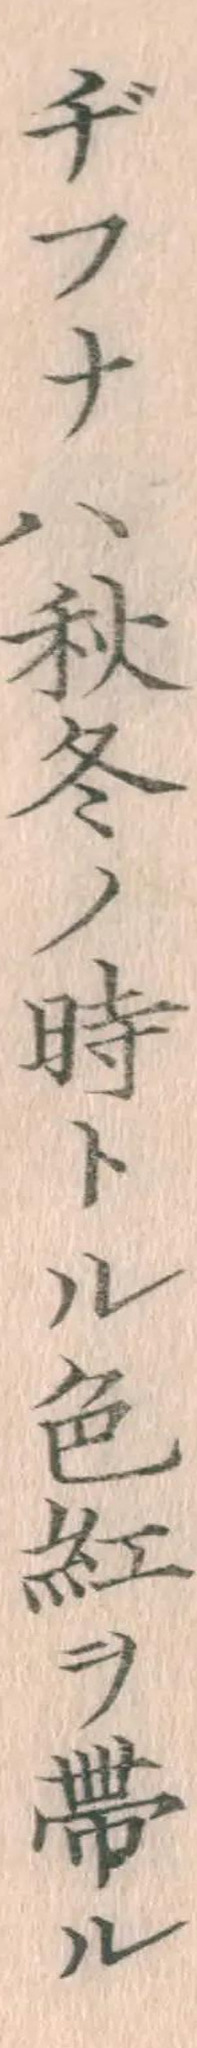ヂフナハ秋冬ノ時トル色紅ヲ帯ル
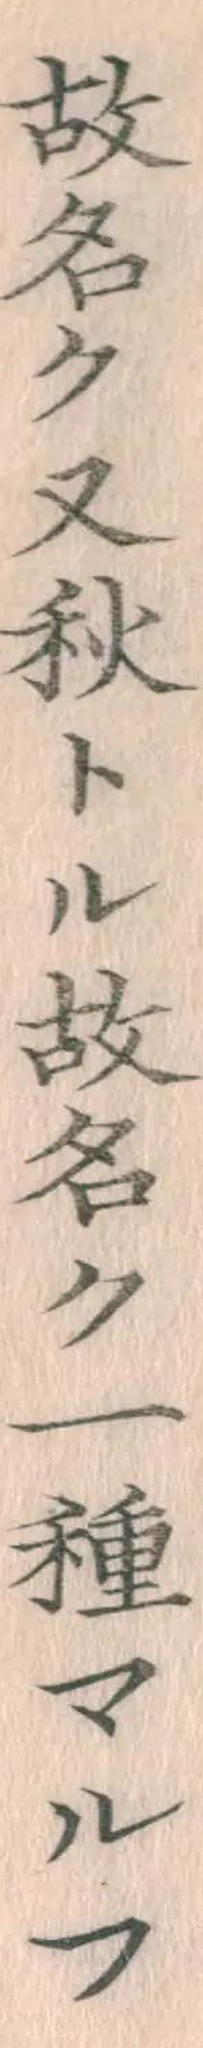故名ク又秋トル故名ク一種マルフ
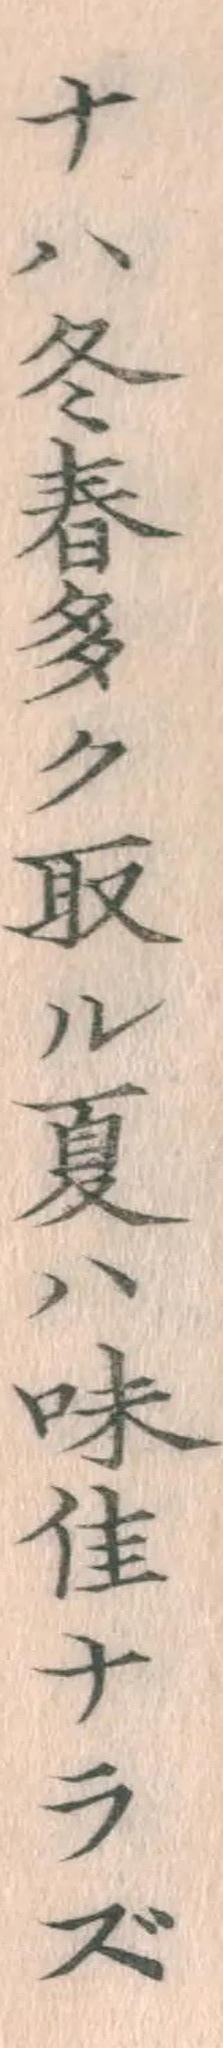ナハ冬春多ク取ル夏ハ味佳ナラズ
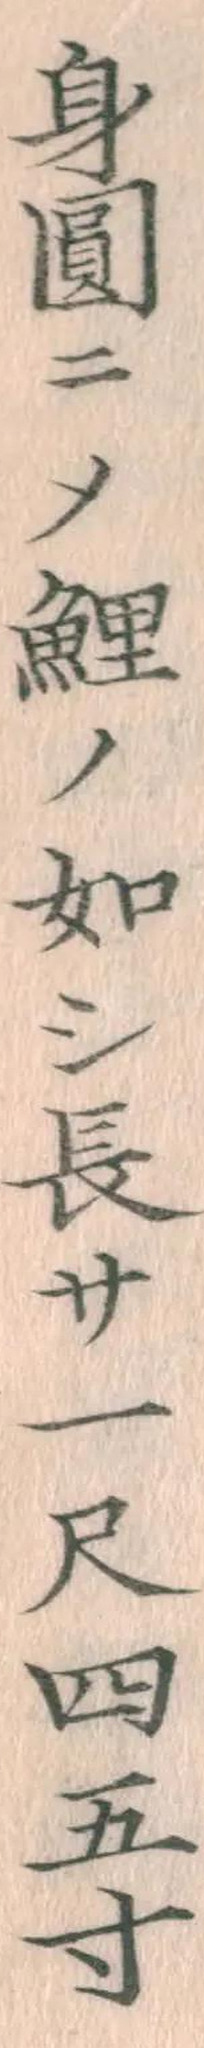身円ニシテ鯉ノ如シ長サ一尺四五寸
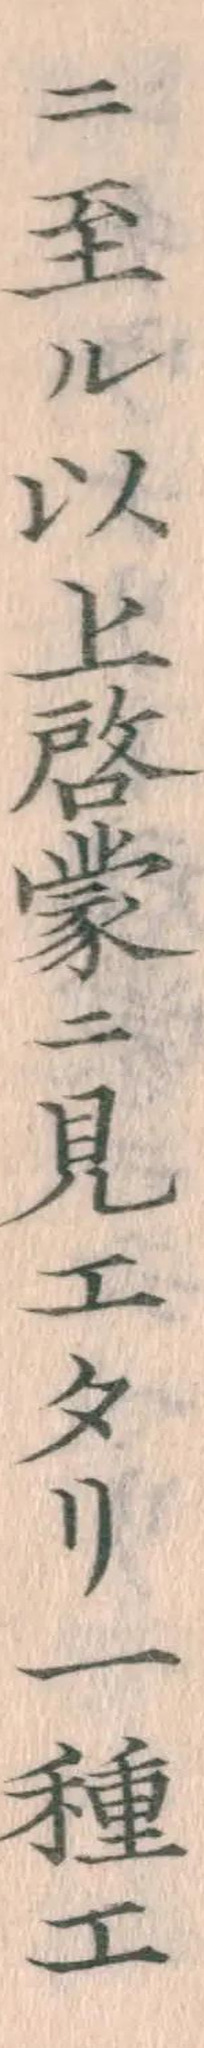ニ至ル以上啓蒙ニ見エタリ一種エ
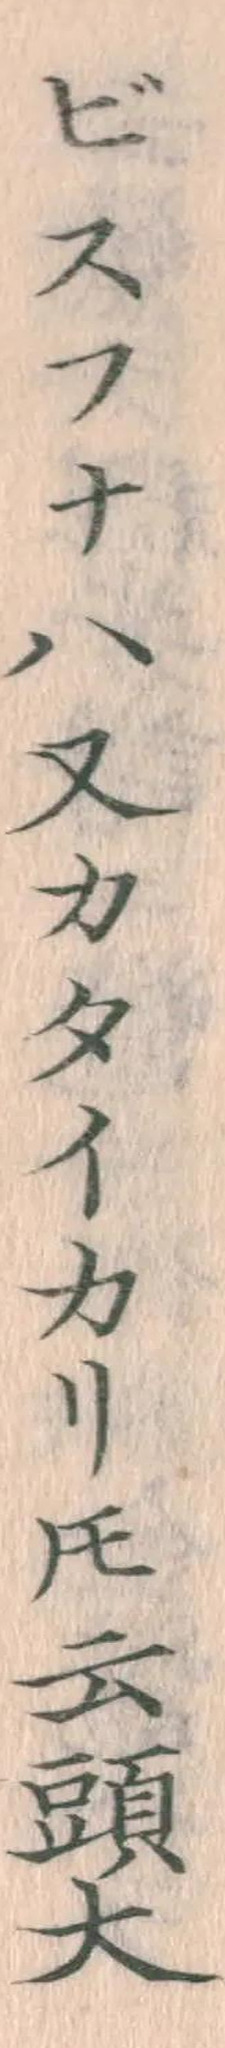ビスフナハ又カタイカリトモ云頭大
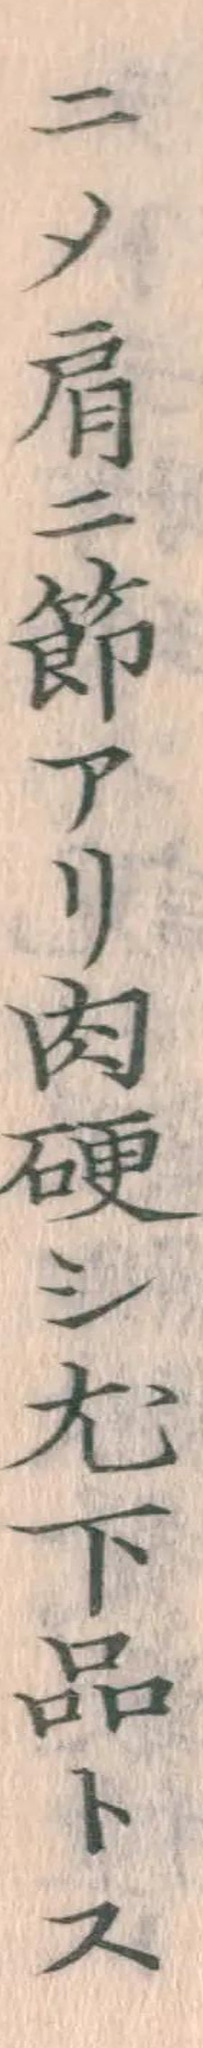ニシテ肩ニ節アリ肉硬シ尤下品トス
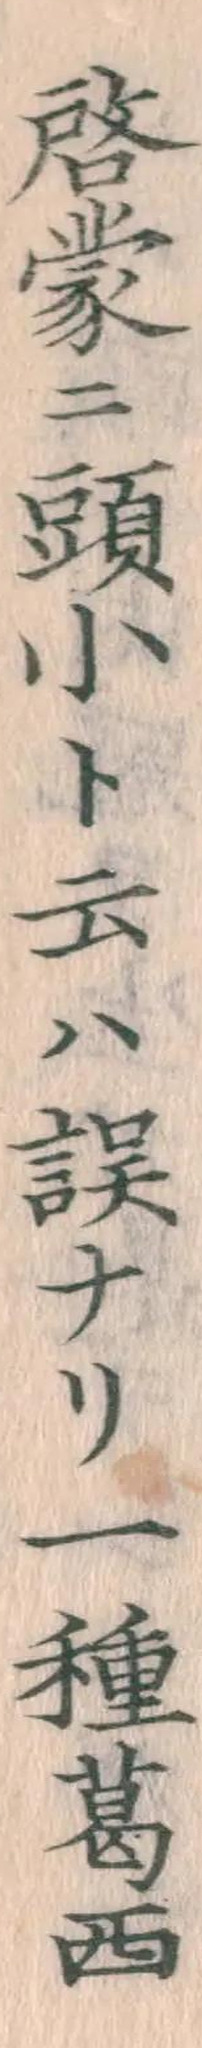啓蒙ニ頭小ト云ハ誤ナリ一種葛西
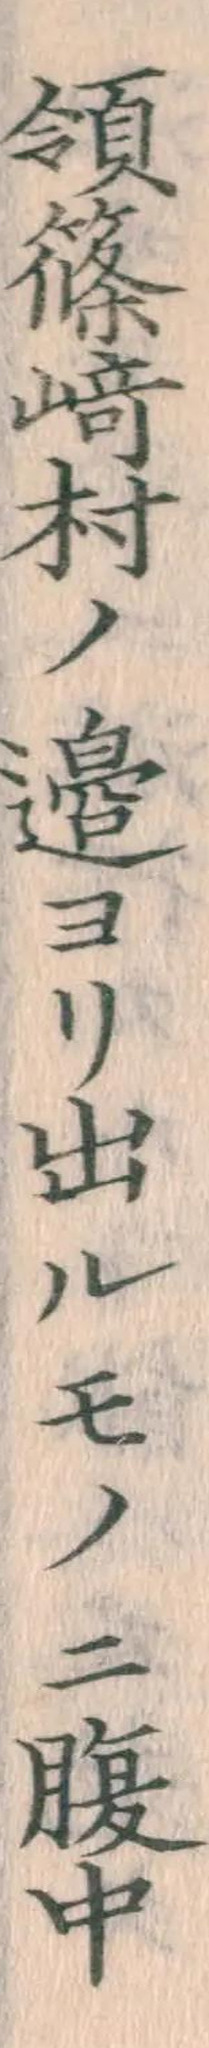領篠崎村ノ辺ヨリ出ルモノニ腹中
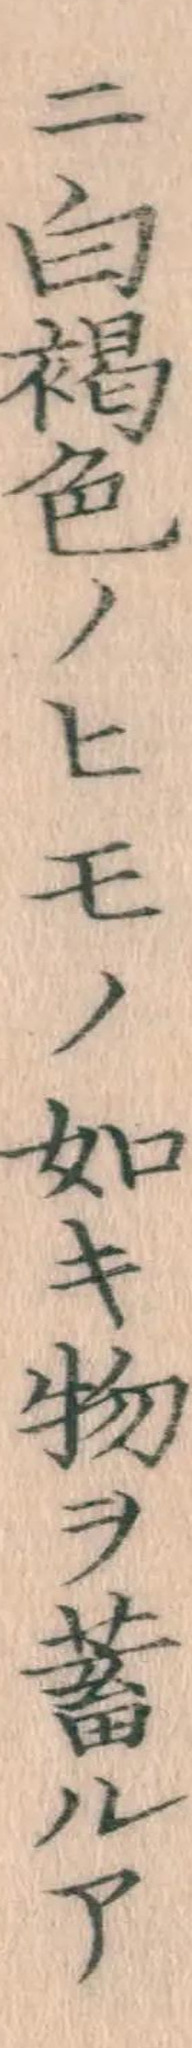ニ白褐色ノヒモノ如キ物ヲ蓄ルア
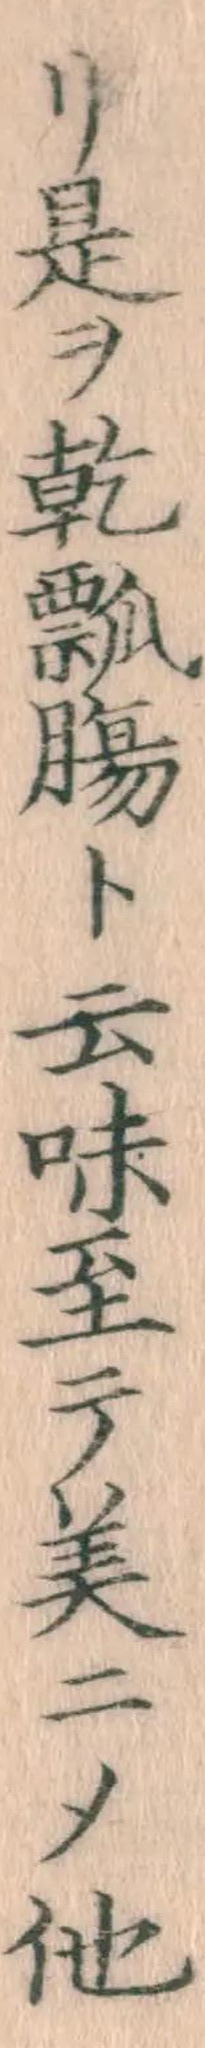リ是ヲ乾瓢腸ト云味至テ美ニシテ他
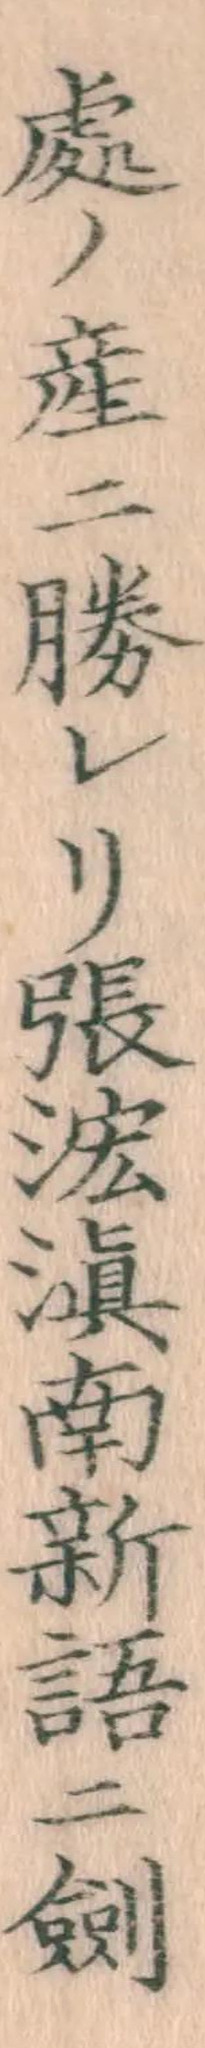処ノ産ニ勝レリ張浤滇南新語ニ剣
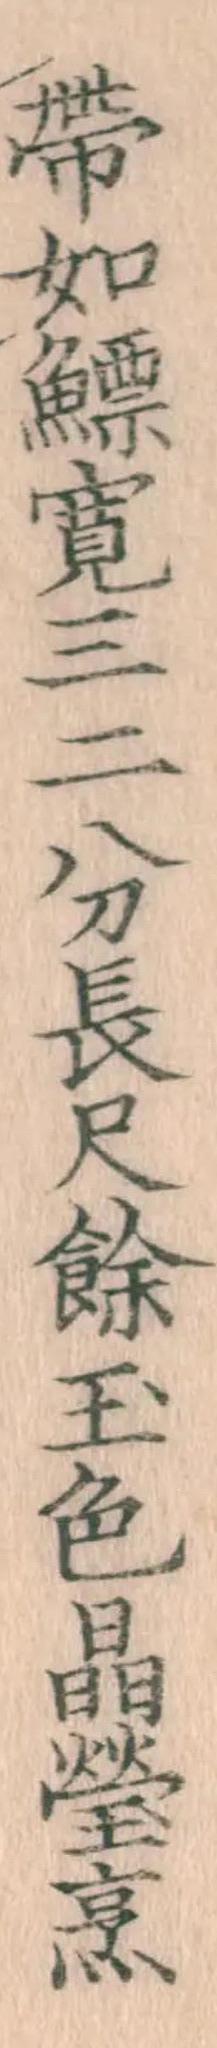帯如鰾寛三二分長尺余玉色晶瑩烹
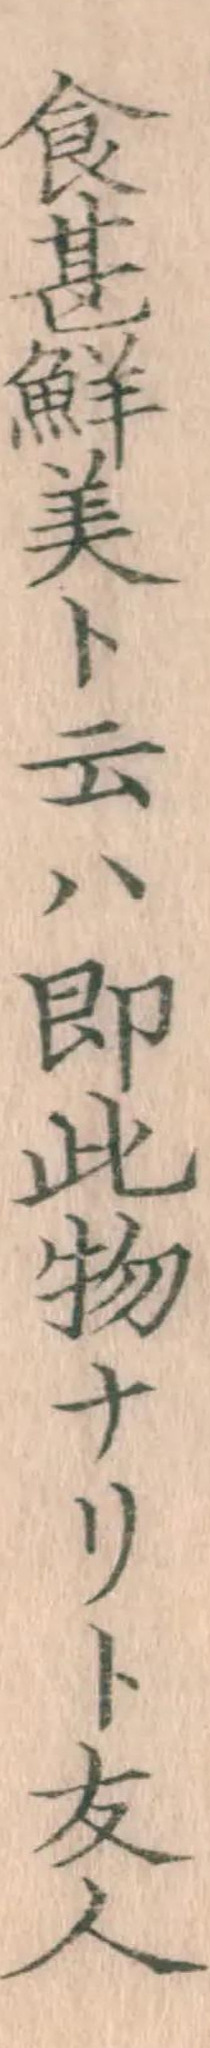食甚鮮美ト云ハ即此物ナリト友人
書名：皇和魚譜 2巻
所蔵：国立国会図書館 National Diet Library, JAPAN
